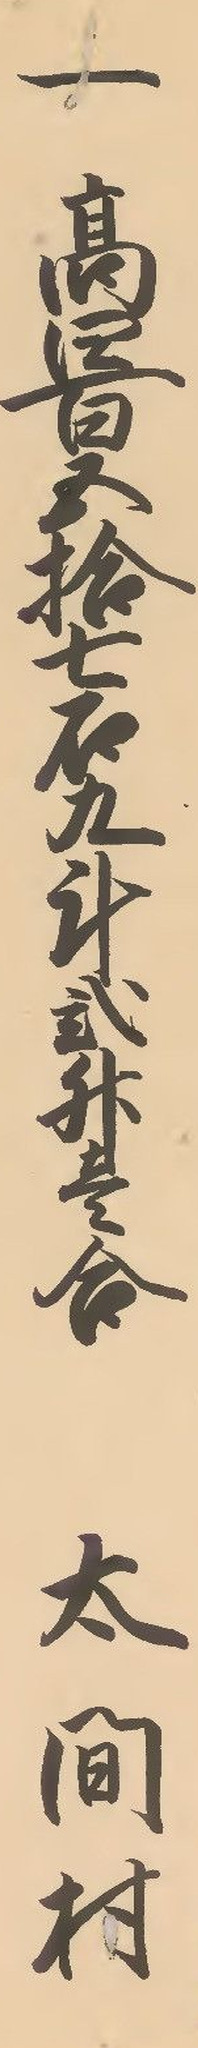一高四百五拾七石九斗弐升壱合太間村
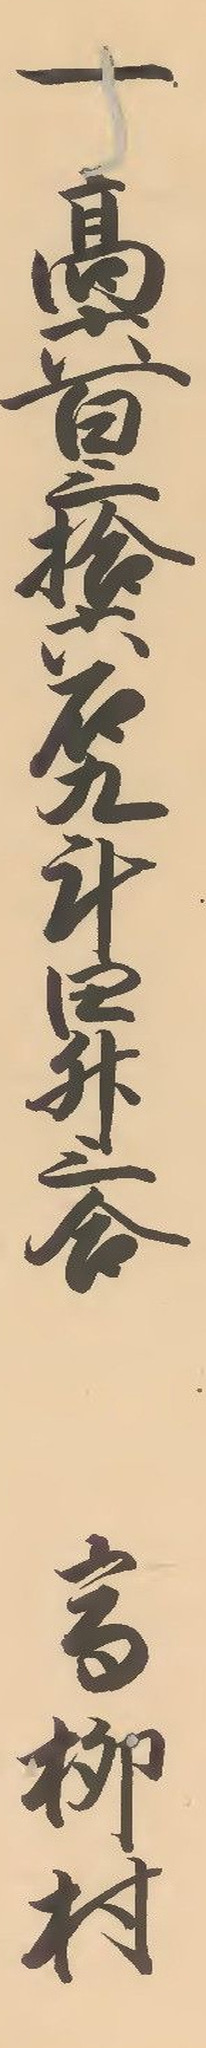一高六百三拾六石九斗四升三合高柳村
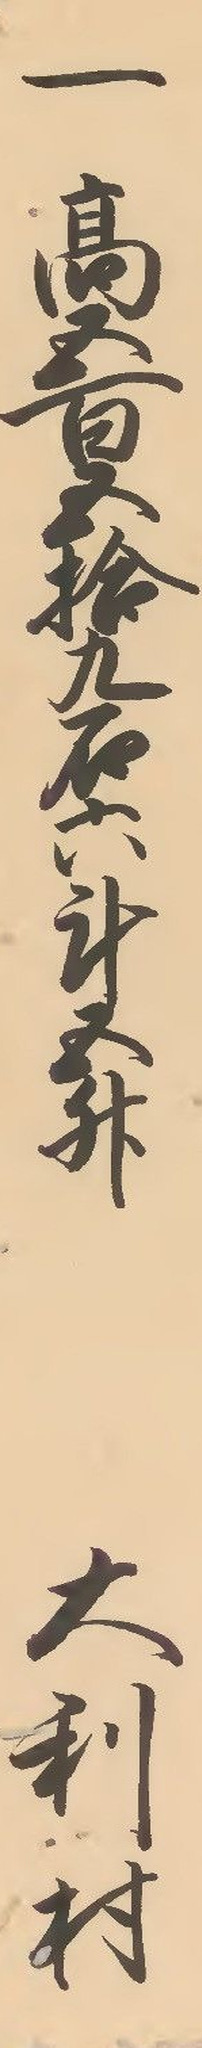一高五百五拾九石六斗五升大利村

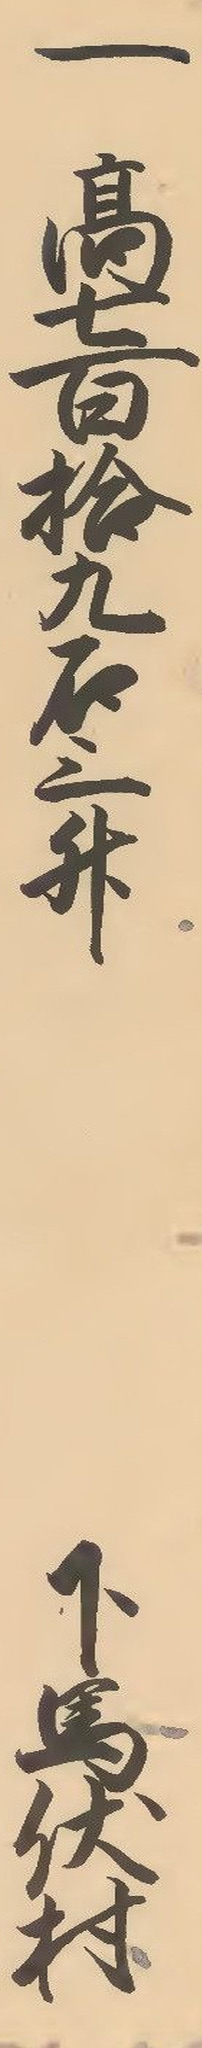一高七百拾九石三升下馬伏村
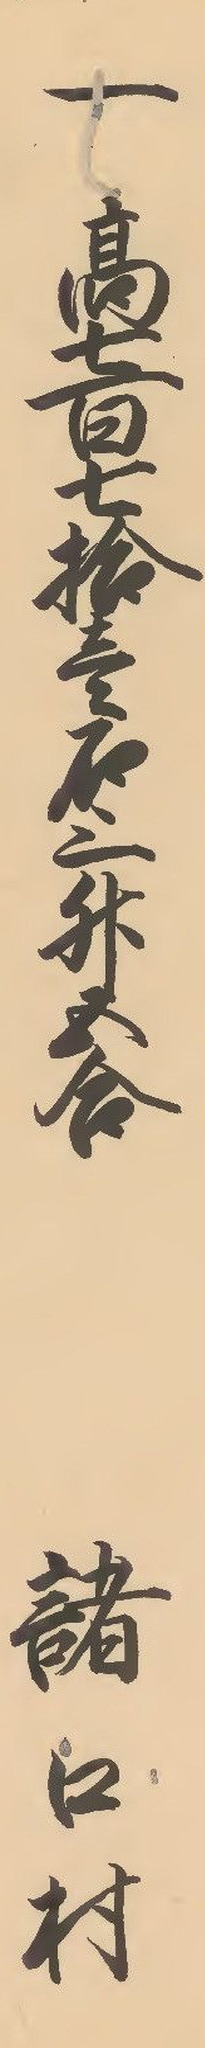一高七百七拾壱石三升五合諸口村
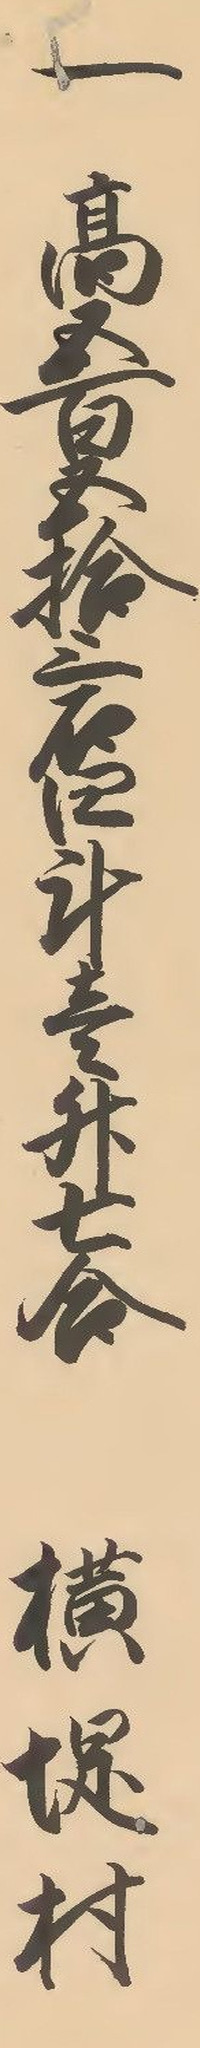一高五百五拾三石四斗壱升七合横堤村
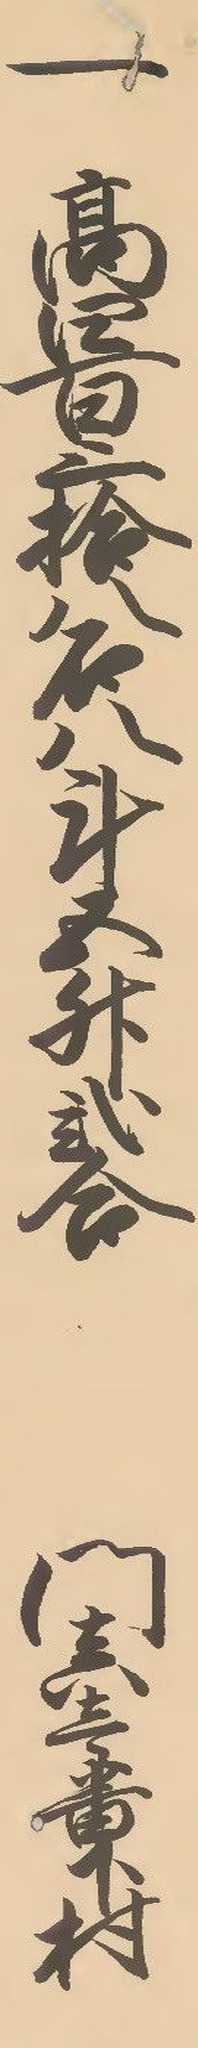一高四百三拾八石八斗五升弐合門真壱番下村
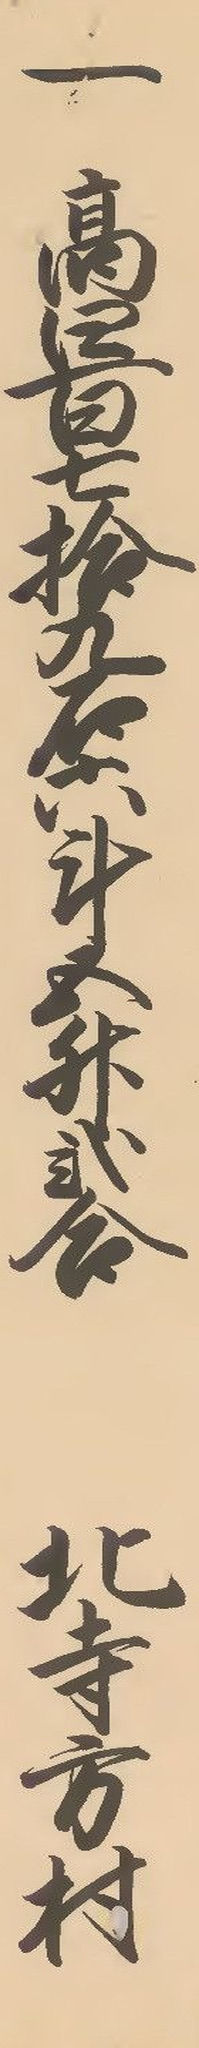一高四百七拾九石六斗五升弐合北寺方村
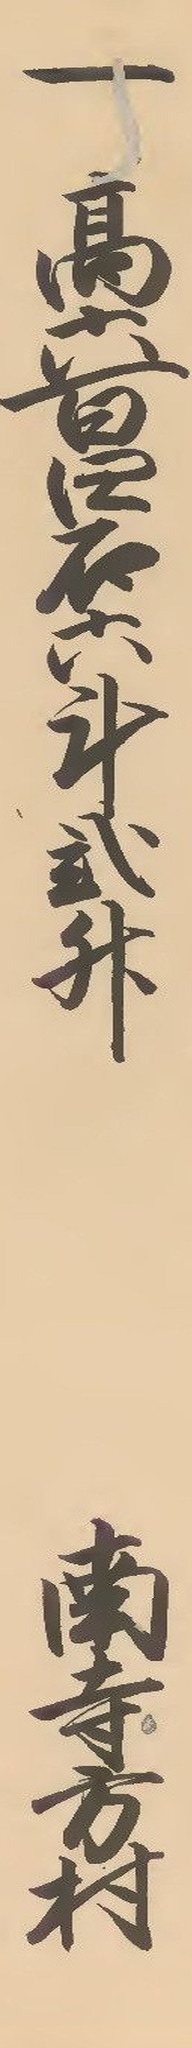一高六百四石六斗弐升南寺方村
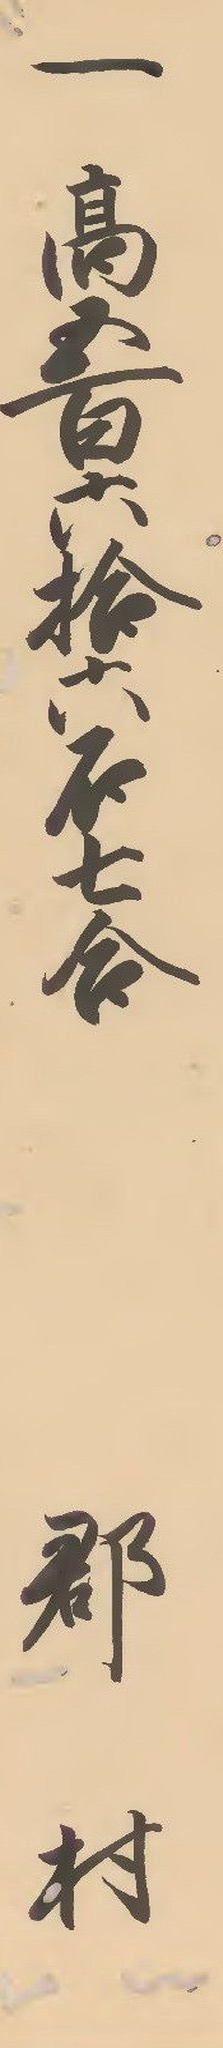一高五百六拾六石七合郡村

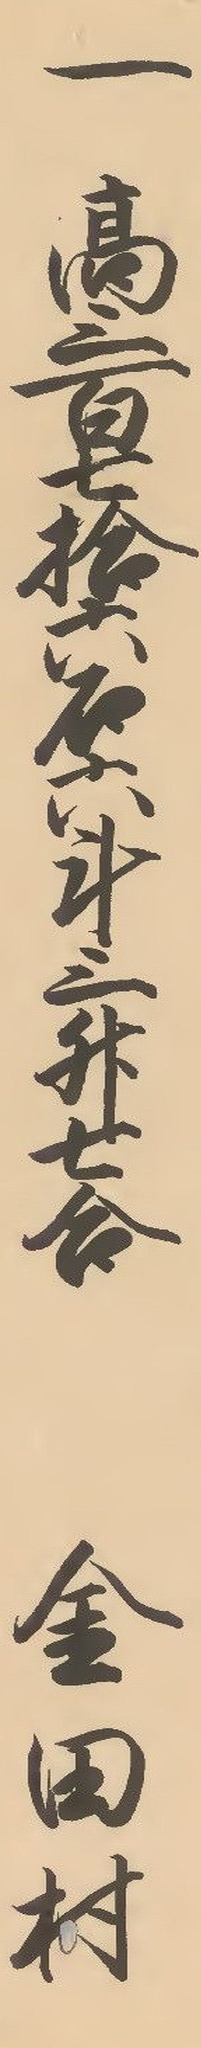一高三百七拾六石六斗三升七合金田村
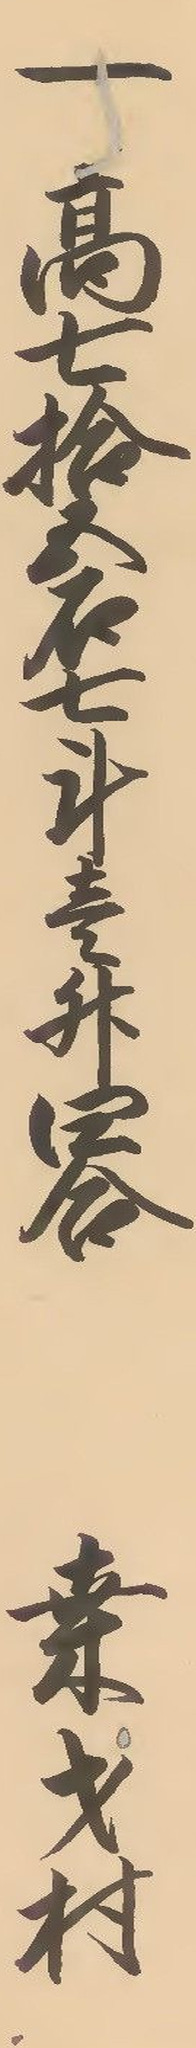一高七拾五石七斗壱升四合桑才村

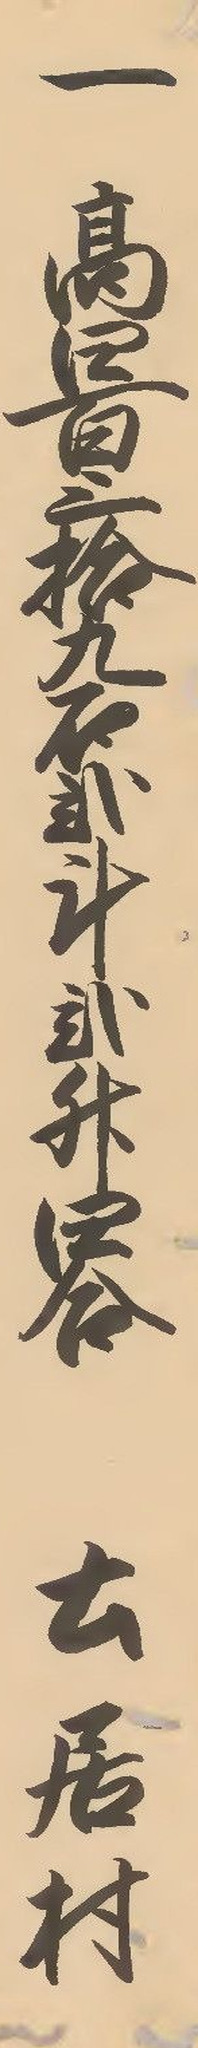一高四百三拾九石弐斗弐升四合土居村
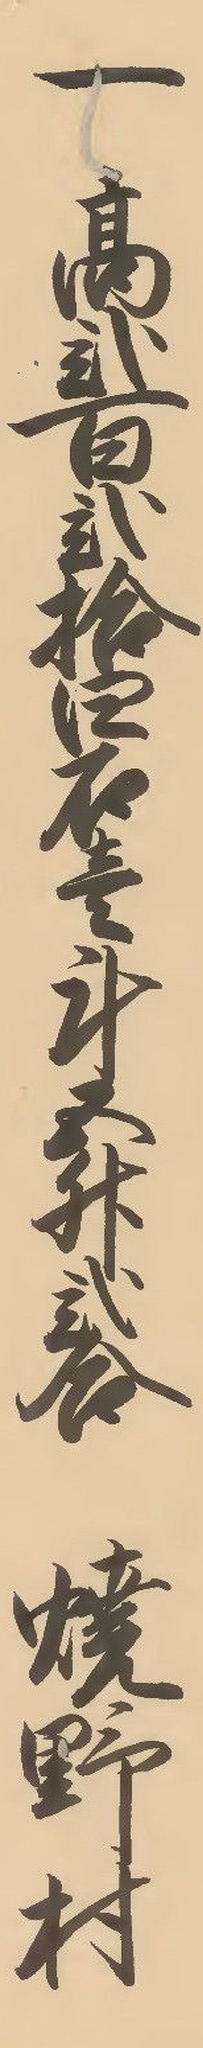一高弐百弐拾四石壱斗五升弐合焼野村
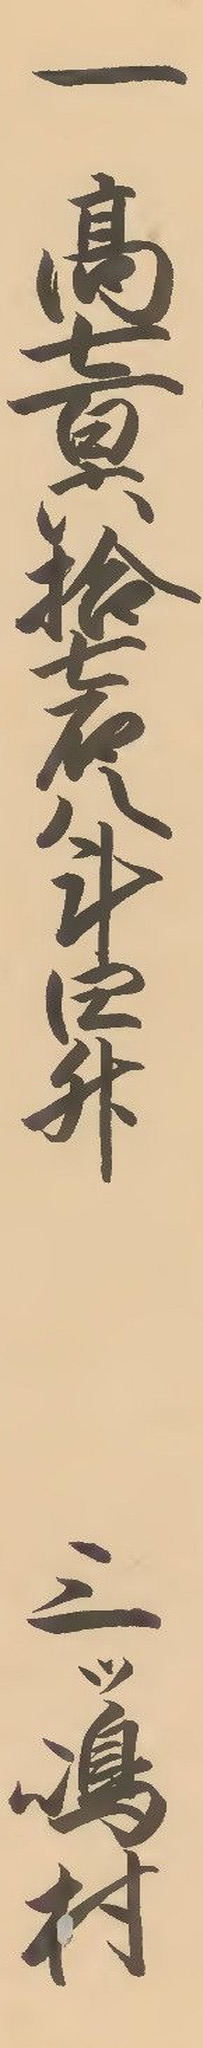一高七百六拾七石八斗四升三ツ島村
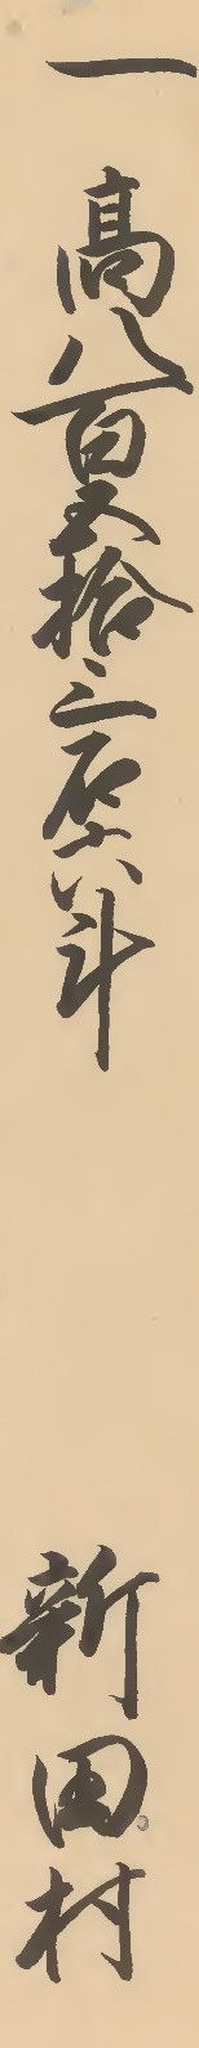一高八百五拾三石六斗新田村
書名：河内国郷帳
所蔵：国立公文書館 National Archives of Japan
